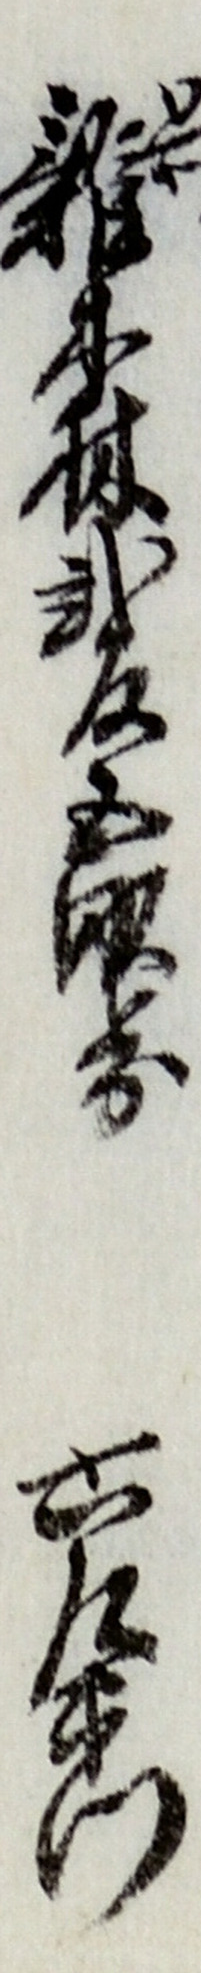雑木林弐反五畝歩六左衛門
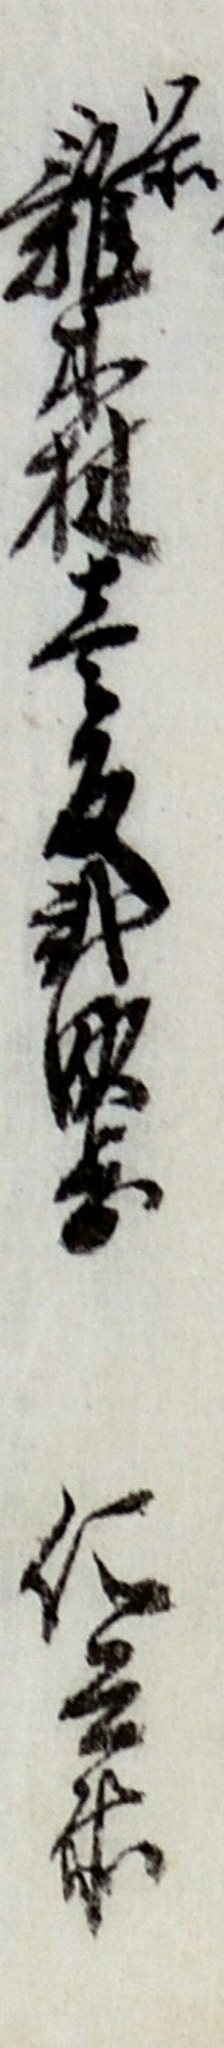雑木林壱反弐畝歩仁兵衛
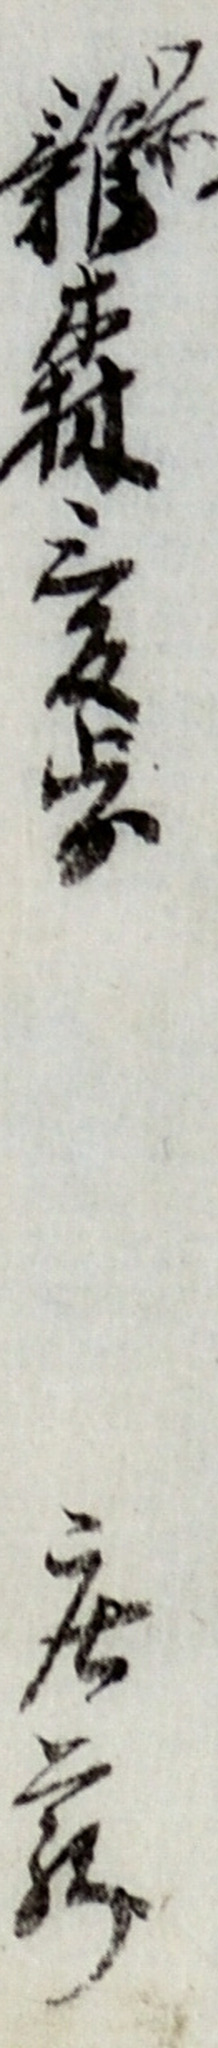雑木林三反歩庄蔵
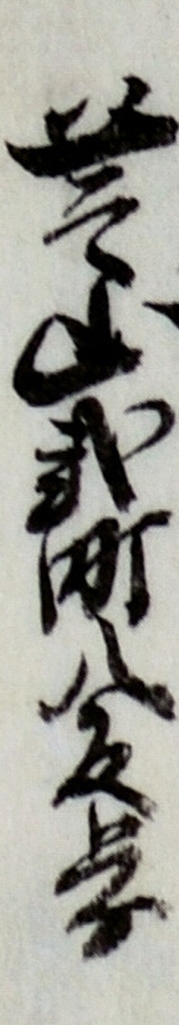芝山弐町八反歩村中
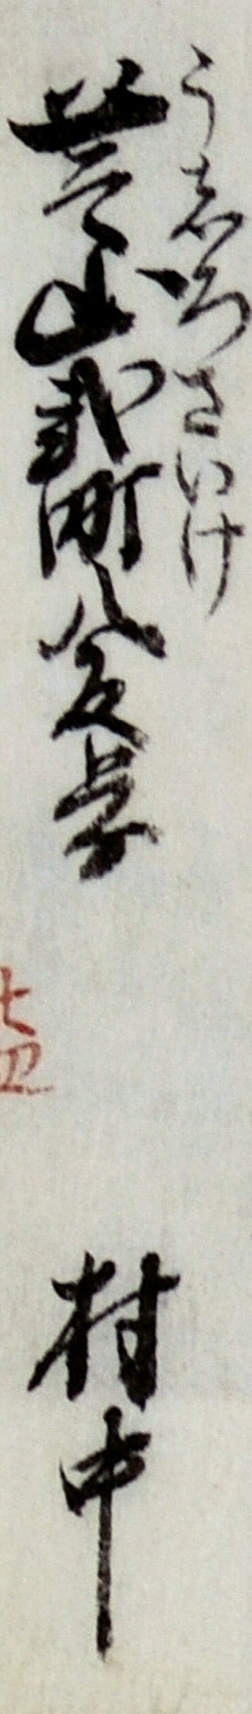芝山弐町八反歩村中

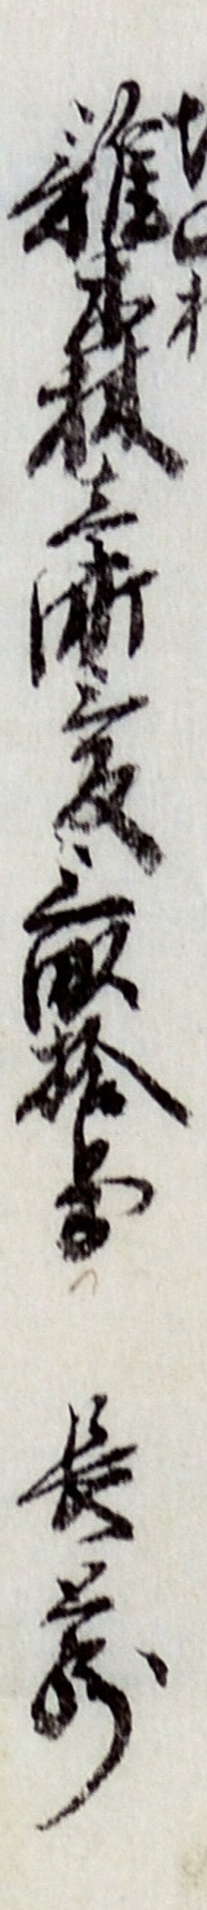雑木林壱町三反三畝拾歩長蔵
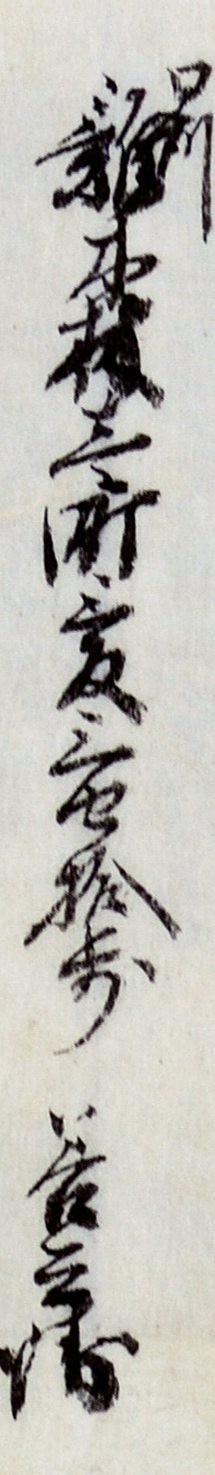雑木林壱町三反三セ拾歩善兵衛
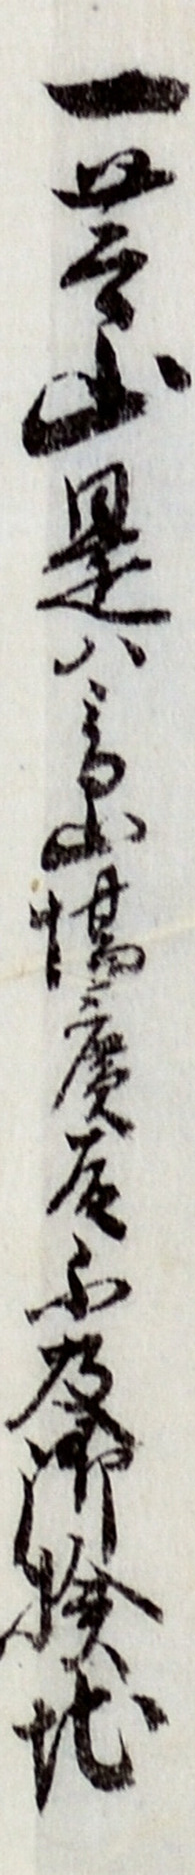一芝山是ハ高山場広故不及御検地
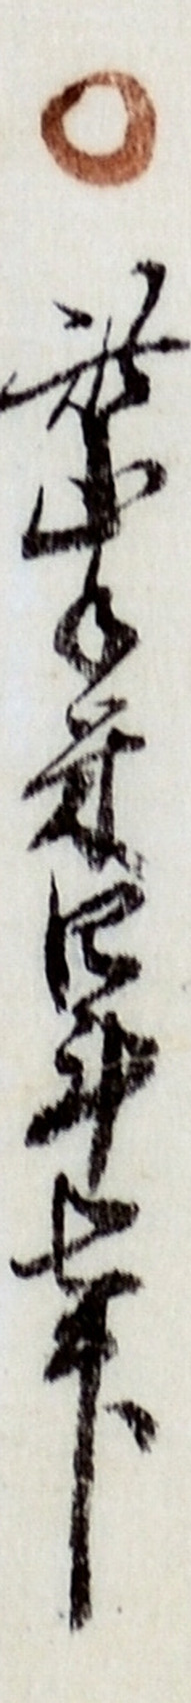○此山手米四斗七升
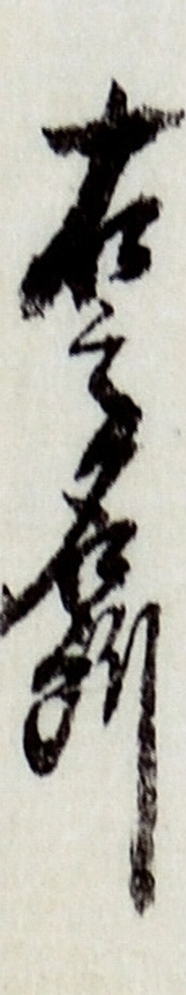右之名所
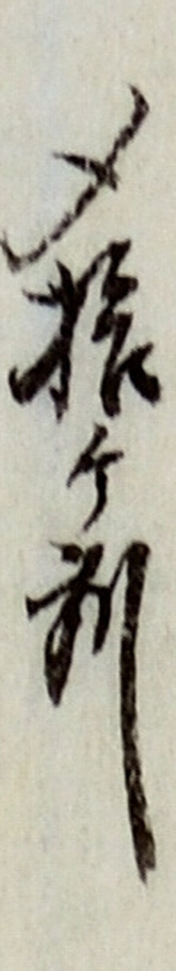〆拾ヶ所

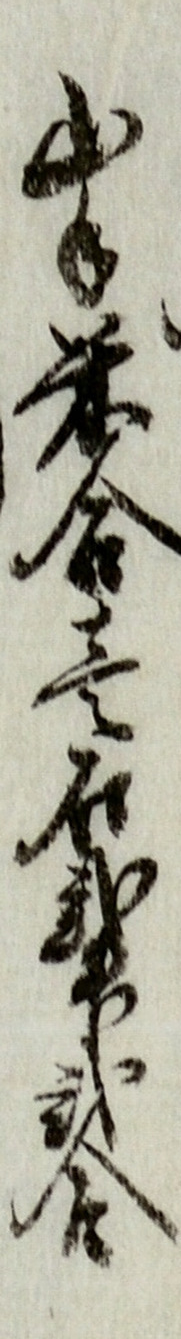山手米合壱石弐升弐合
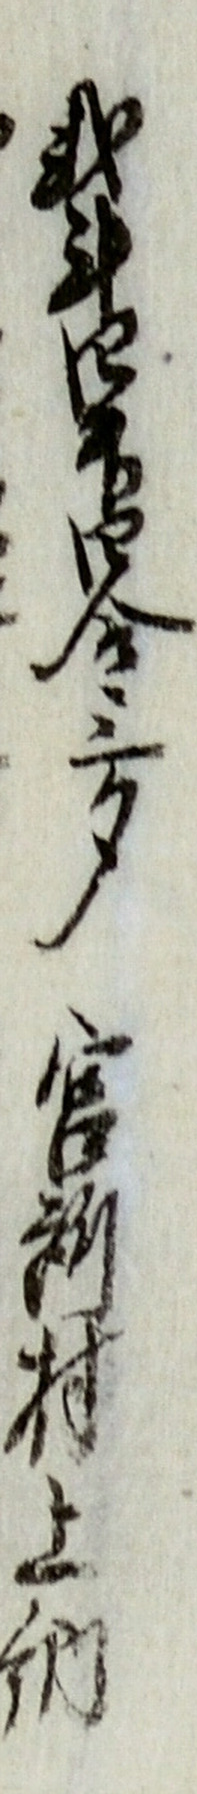弐斗四升四合三勺宮所村上納
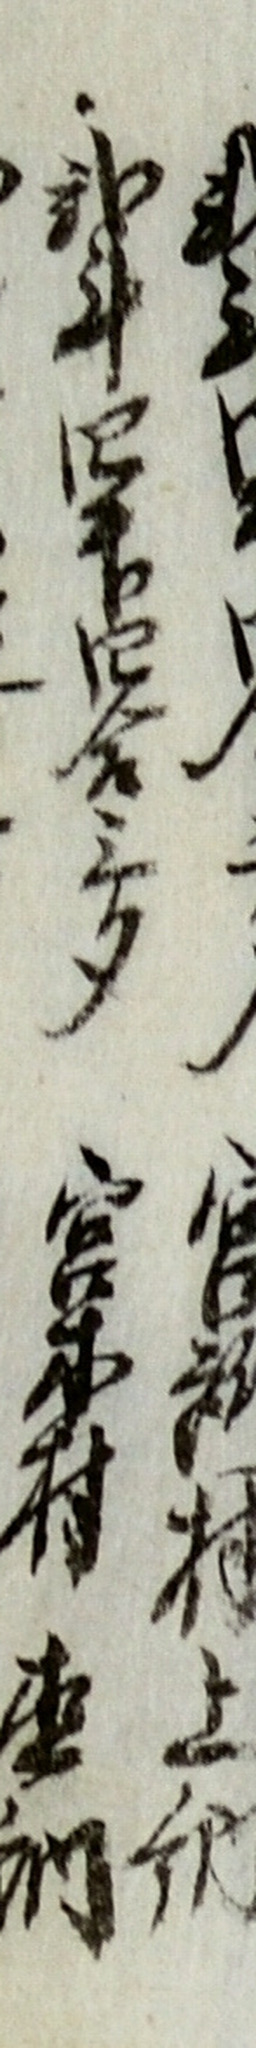・弐斗四升四合三勺宮木村直納
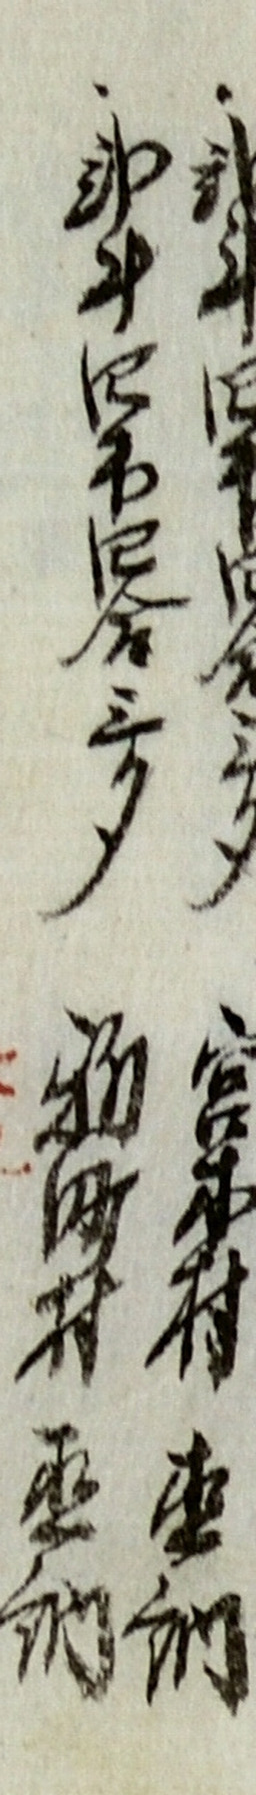・弐斗四升四合三勺新町村直納

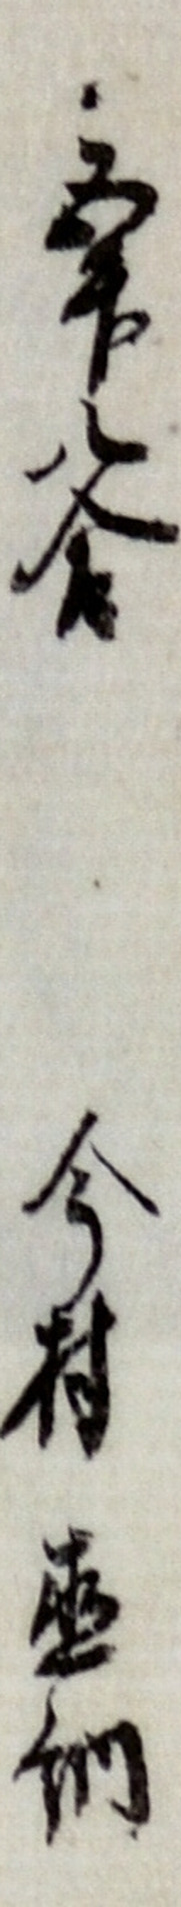・五升八合今村直納
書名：御領分中山林社地手控
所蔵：伊那市立高遠町図書館・合同会社AMANE
